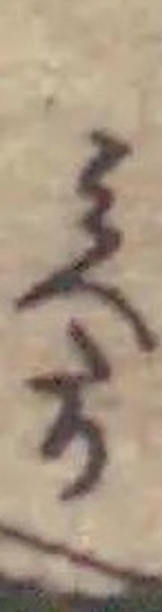みへたり
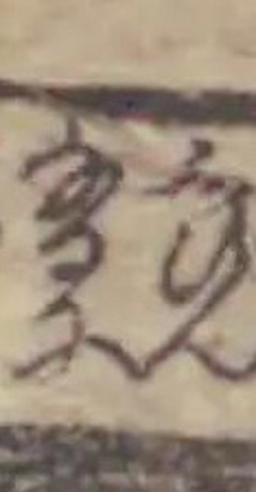なるに
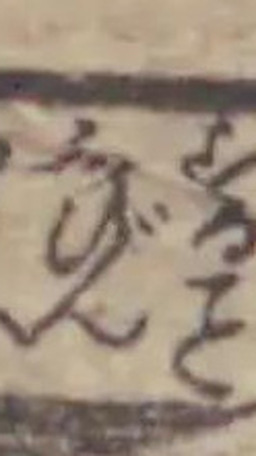ふびん
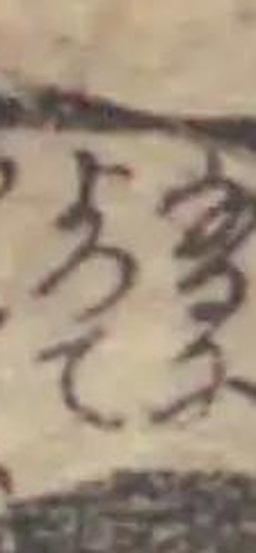よつて
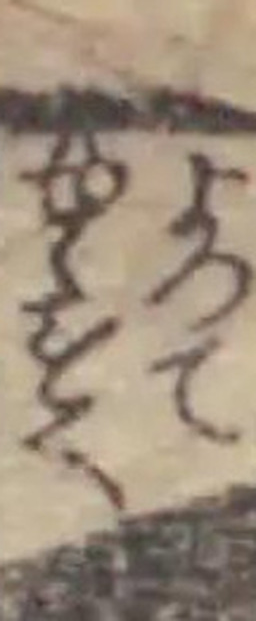ゆくすへ
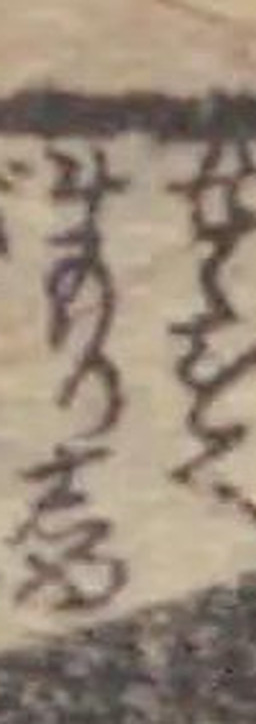まもりしゆ
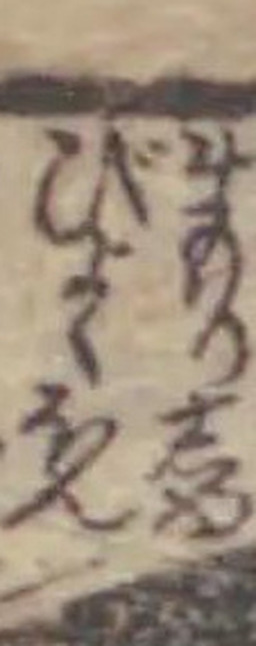びよくほん
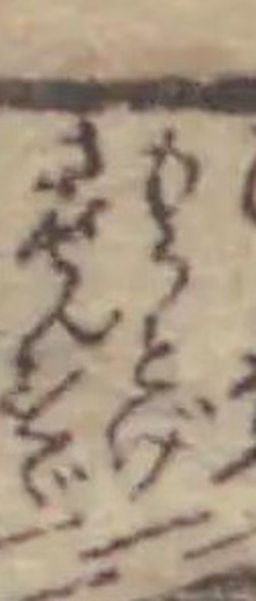させんすゞ
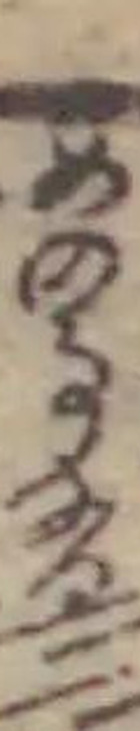めの事なる
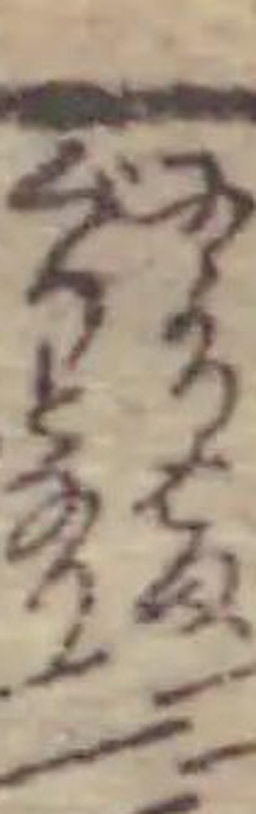ぐりとなり
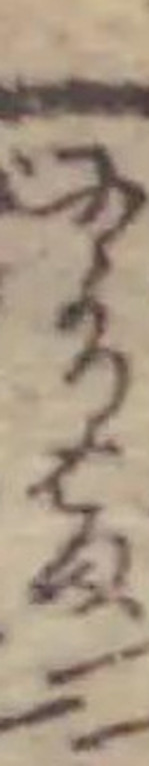によりはま
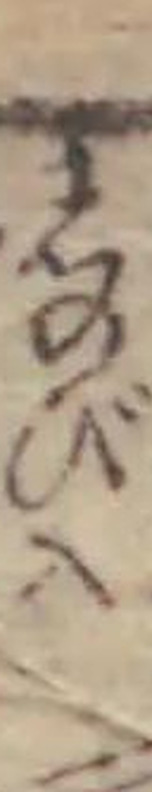しのび入
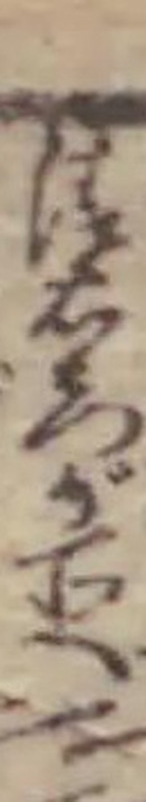清右エ門が処へ
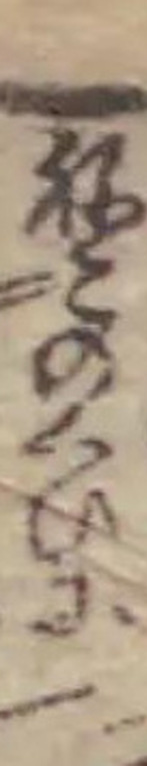ねこのくひに
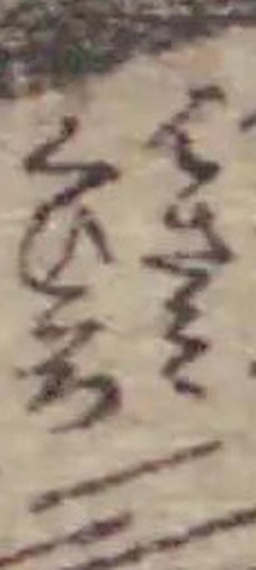くひころ

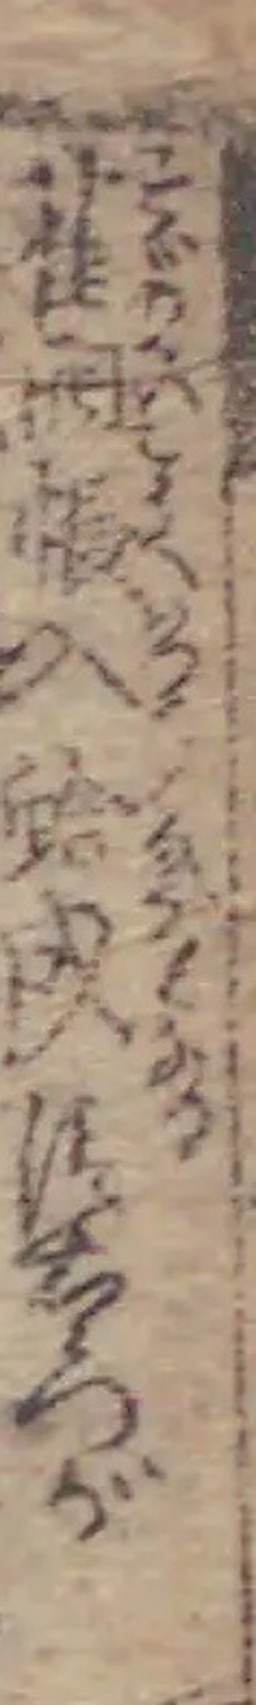雀開帳入蛤成清右エ門が
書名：冷水灰毛猫 2巻
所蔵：国立国会図書館 National Diet Library, JAPAN
